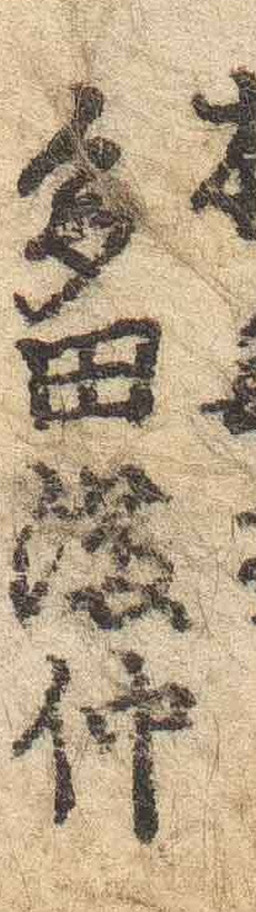多田満仲
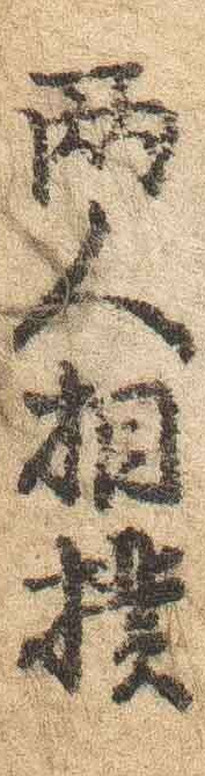両人相撲

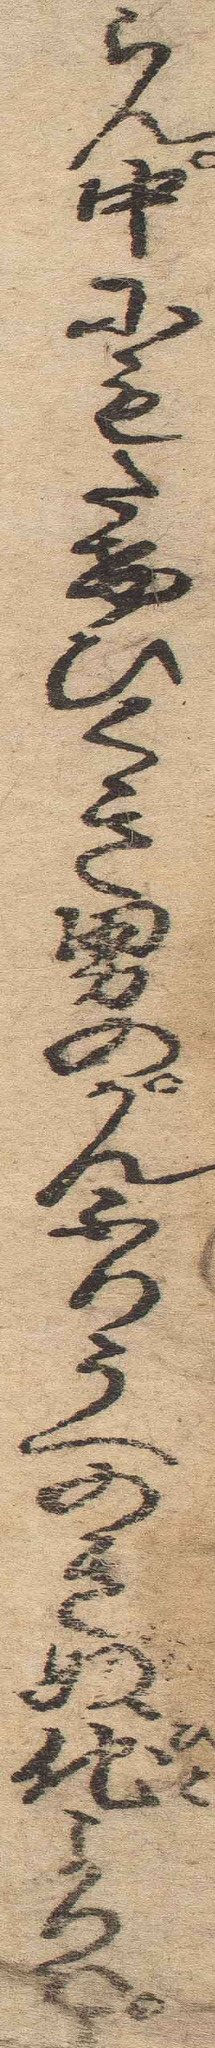らん。中にもたけひくき男の。かんふりうへのきぬ他よりは。よ
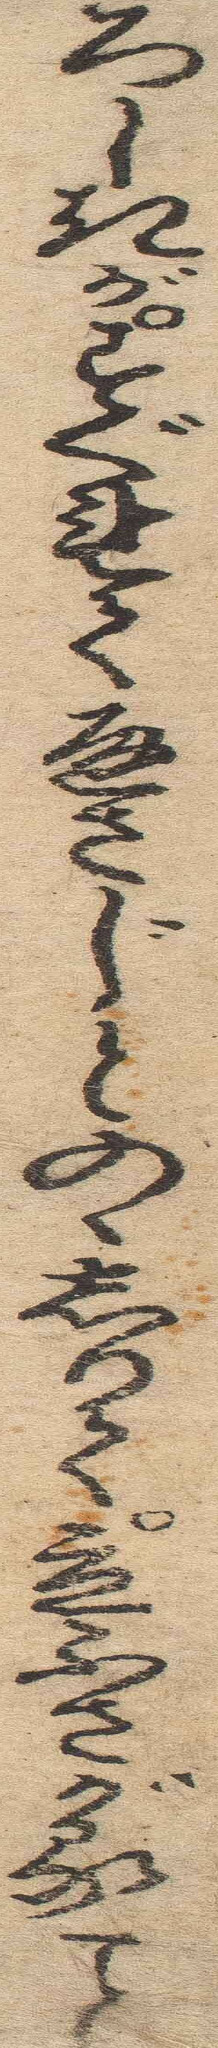ろしきが。すぐれて通さじとのゝしりて。立ふさがること
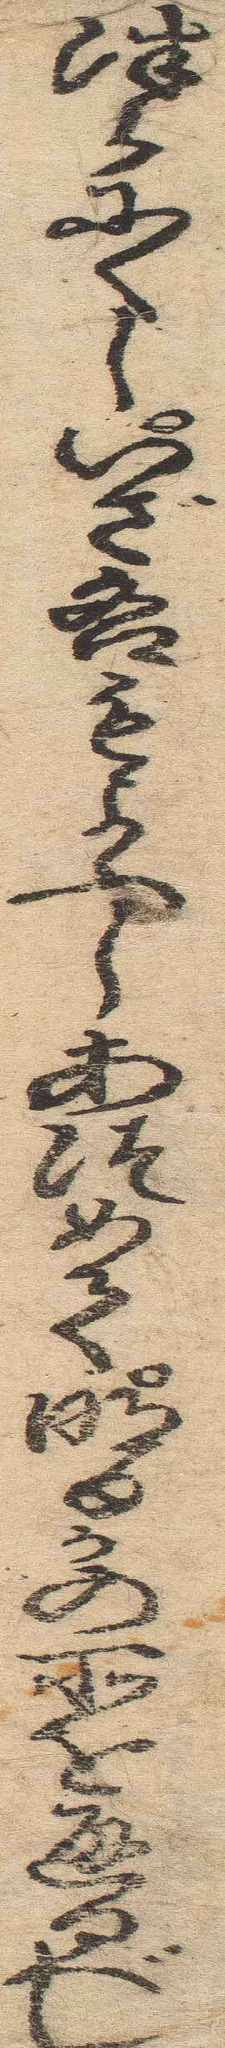つらにくし。いざ各もようしあつめて。明日かの所を通るべし
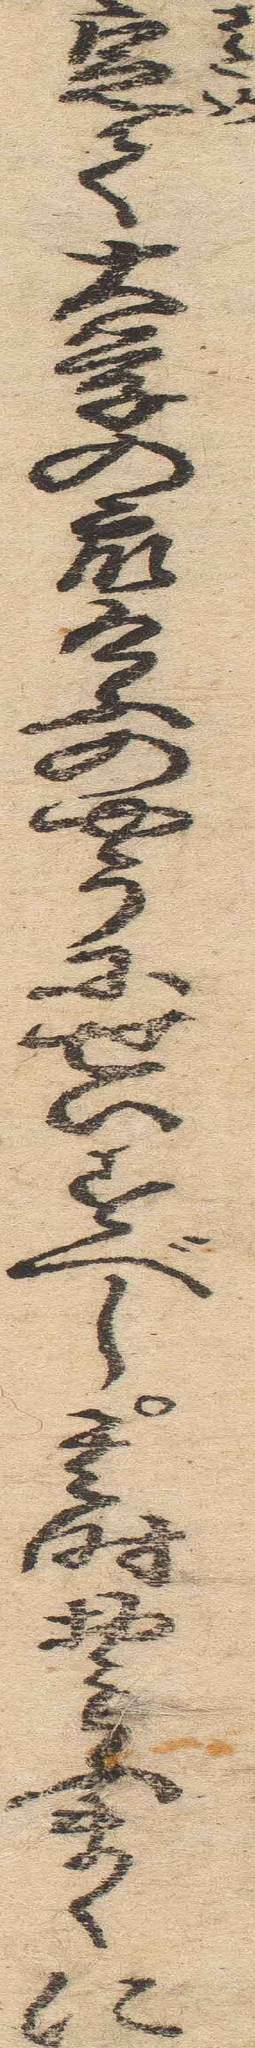定て大学の衆けふのやうにせいすべし。其時おとなふまゝに
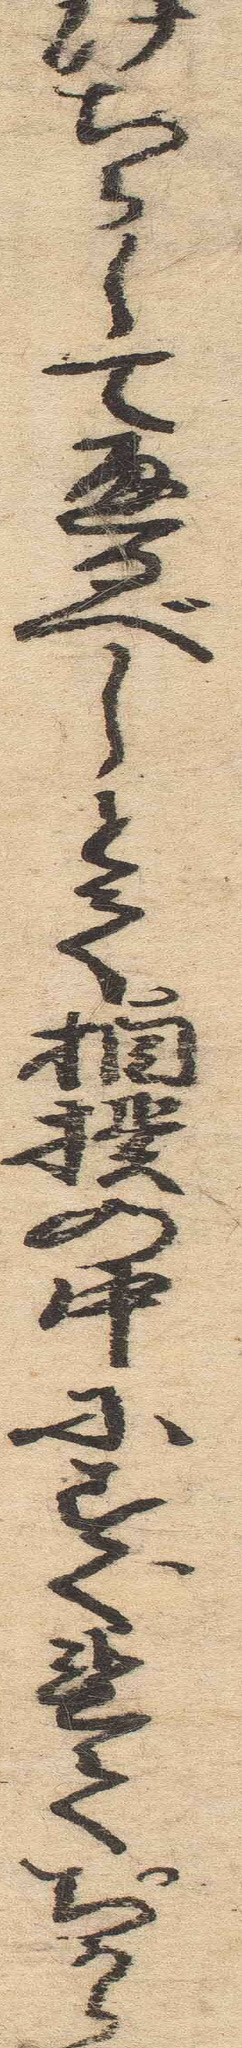けちらして通るべしとて相撲の中にすぐれて。ちから
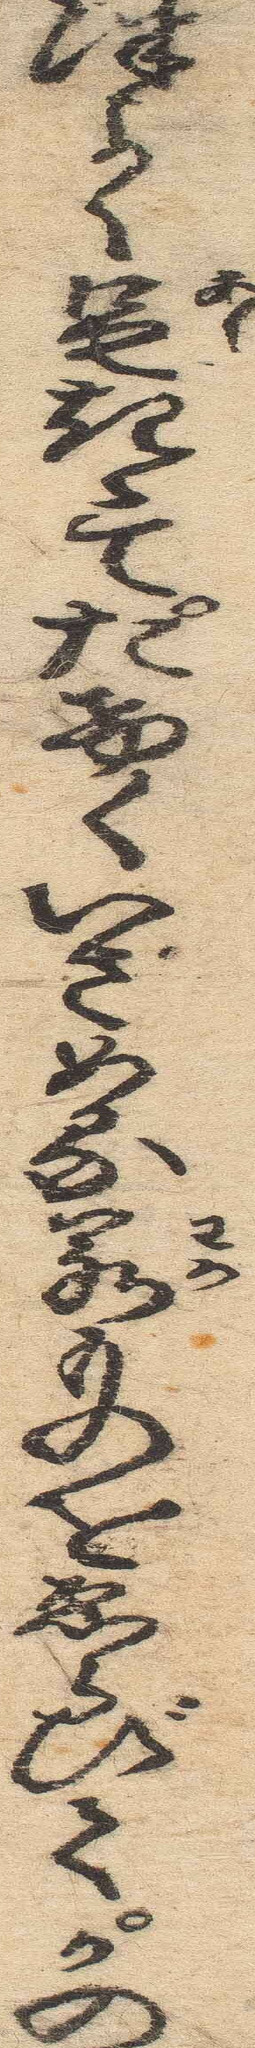つよく足きゝてたかくいさめる若ものをゑらびて。かの
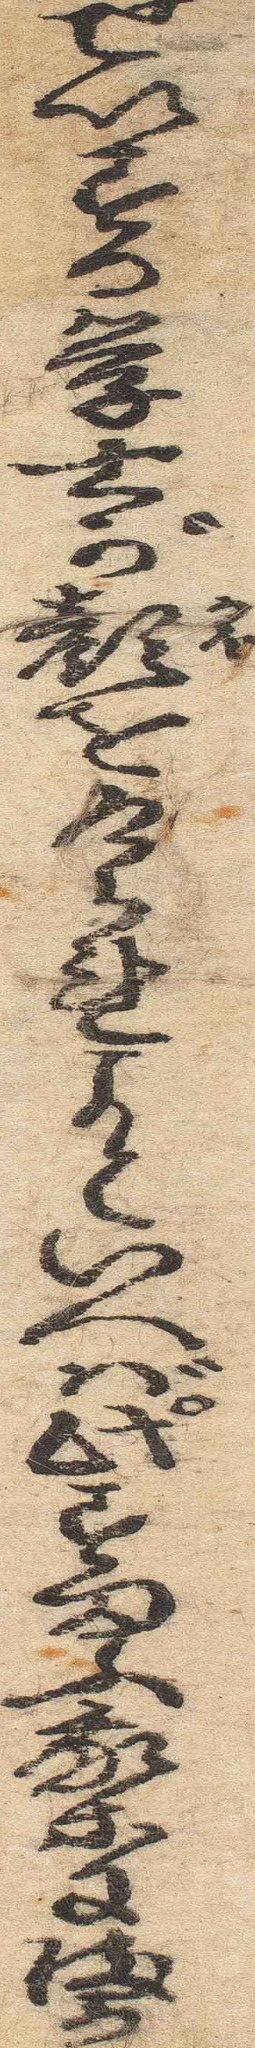せいする学士が顔をけられよといへば。此すまふ我等にまか
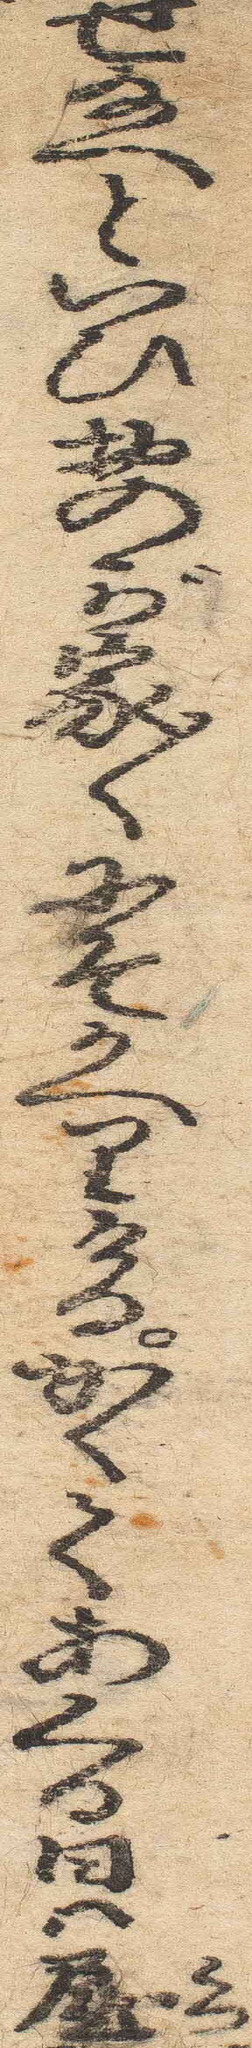せ給へといひおのが家〳〵にそかへりける。かくてあくる日は屈
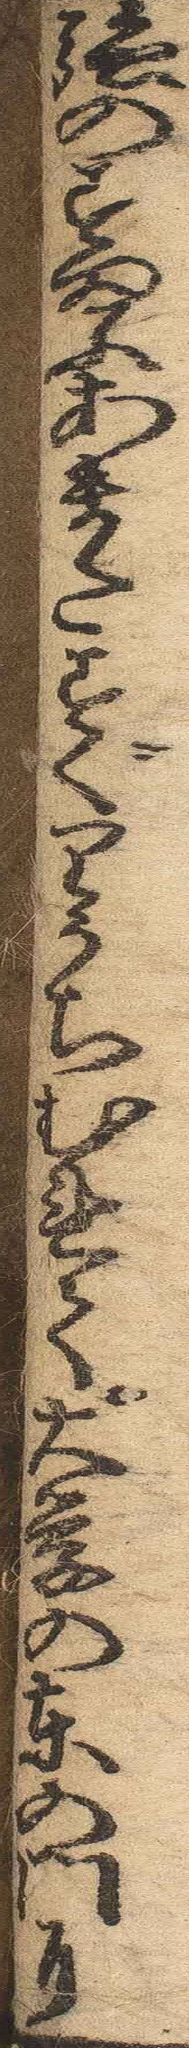強のすまふあまたすぐりうちむれて。大学の東之門に
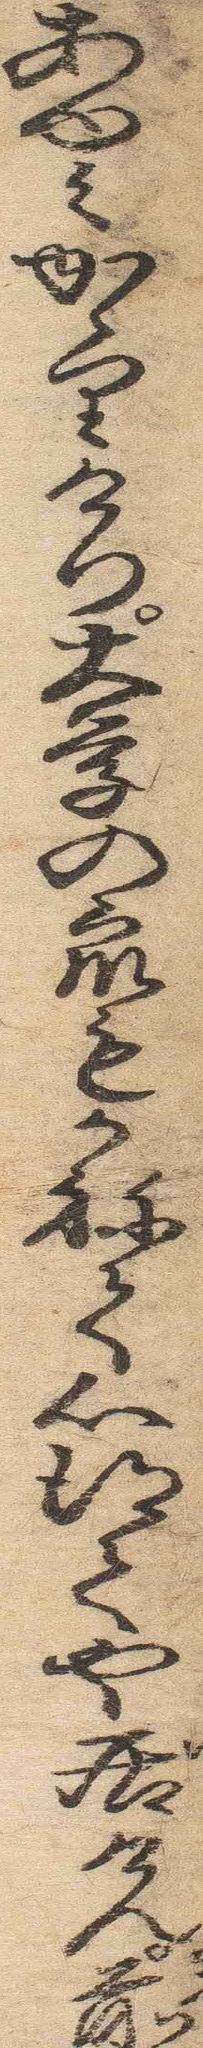あゆみかゝり。大学の衆もかねて心得てや居けん。前
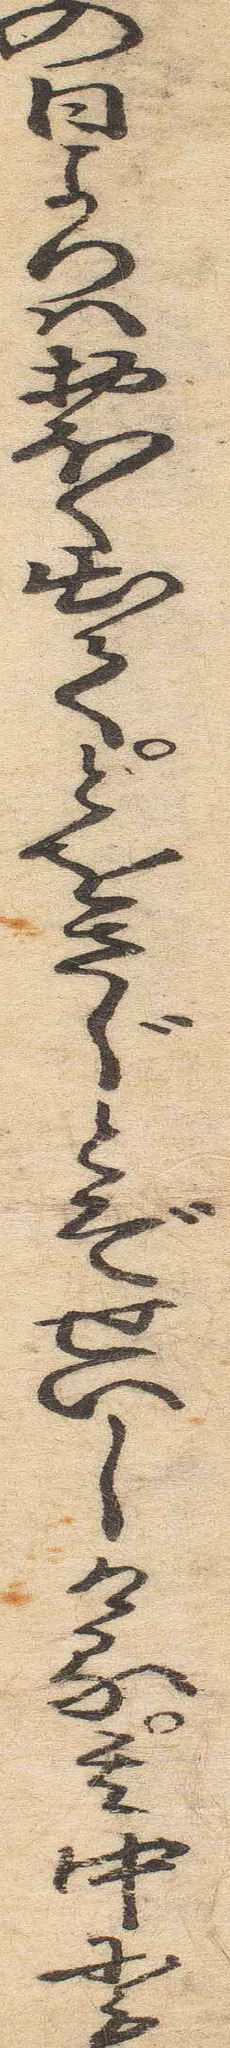の日よりはおほく出て。とをさじとぞせいしける。其中にも
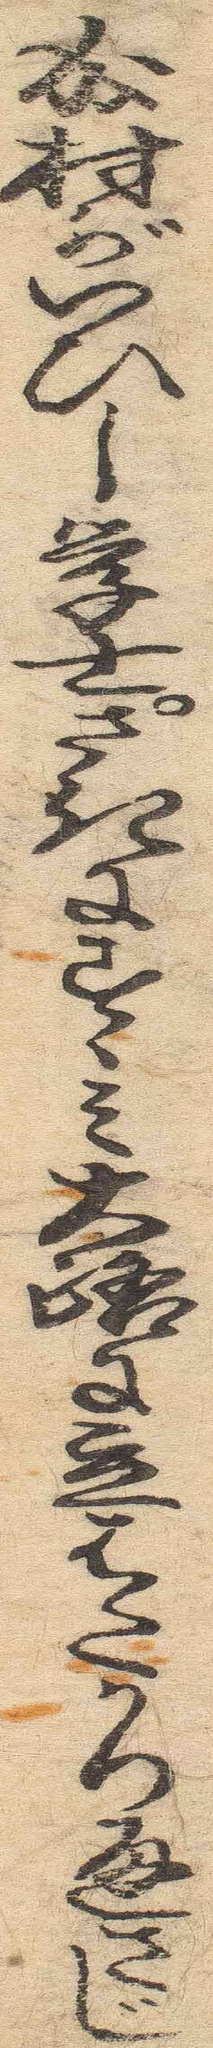成村がいひし学士さきにすゝみ大路に立はたかり通さじ
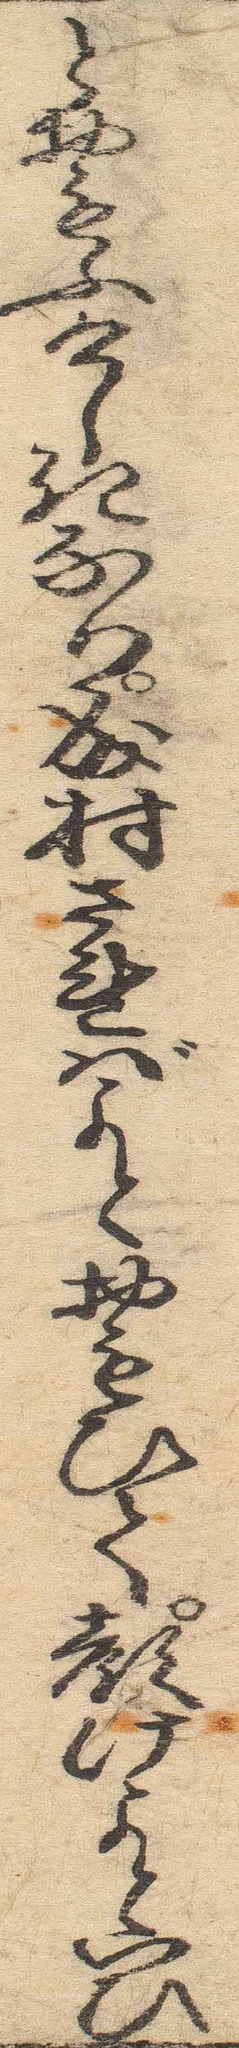とおもふけしきなり。成村さればよくおもひて。顔けよといひ
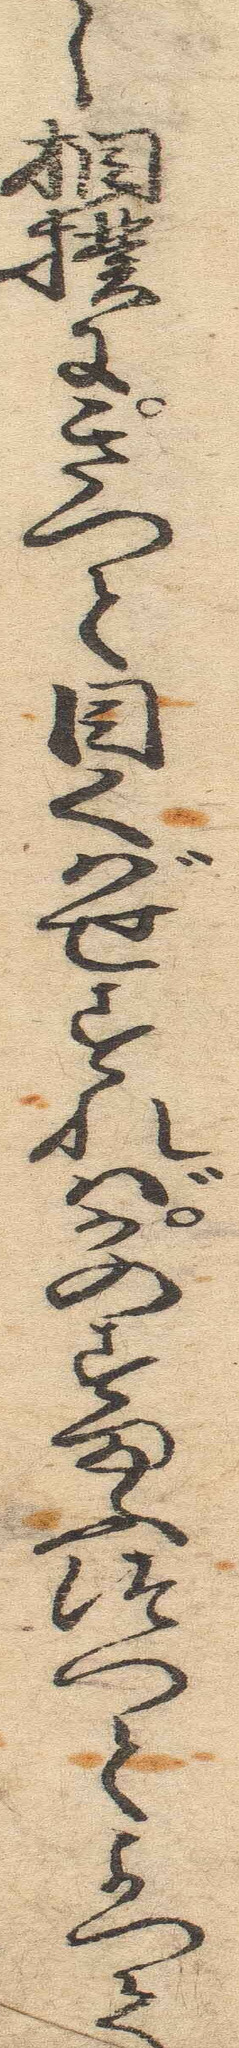し相撲に。きつと目くばせすれば。かのすまふつよくよつて
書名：古今相撲大全
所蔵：東京学芸大学附属図書館 国文学研究資料館
